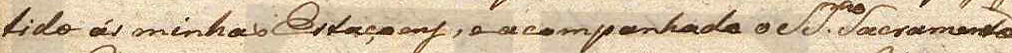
tido ás minhas Estaçoens, e acompanhado o SS.mo Sacramento
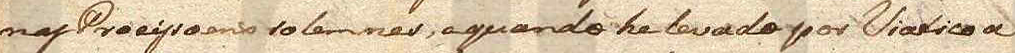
nas Procissoens solemnes, e quando he levado por Viatico a
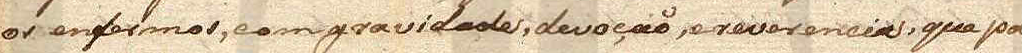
os enfermos, com gravidade, devoçaõ, e reverencia, que pa
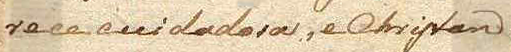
rece cuidadosa, e Christan.
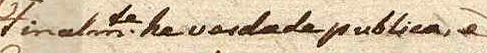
Finalm.te he verdade publica, e
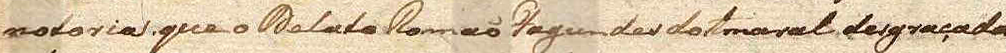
notoria que o Delato Romaõ Fagundes do Amaral desgraçada
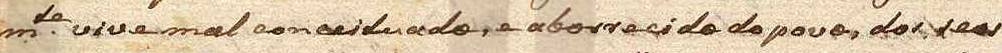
m.te vive mal conceituado, e aborrecido do povo, dos seos
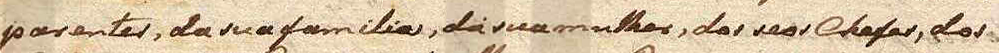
parentes, da sua familia, da sua mulher, dos seos Chefes, dos
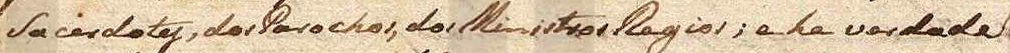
Sacerdotes, dos Parochos, dos Ministros Regios; e he verdade
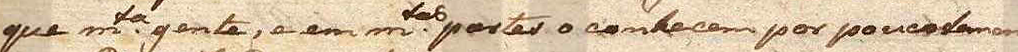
que m.ta gente, e em m.tas partes o conhecem por pouco temen
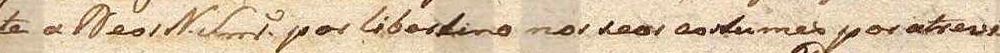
te a Deos N. Snr̄. por libertino nos seos costumes por atrevi
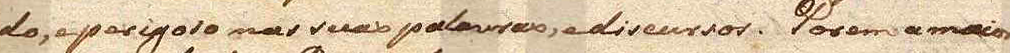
do, e perigoso nas suas palavras, e discursos. Porem a maior
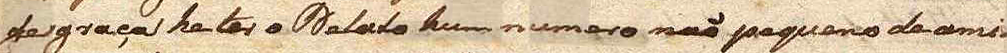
desgraça he ter o Delato hum numero naõ pequeno de ami
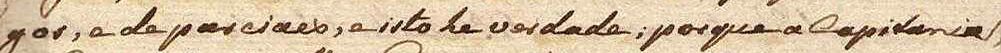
gos, e de parciaes, e isto he verdade; porque a Capitania,
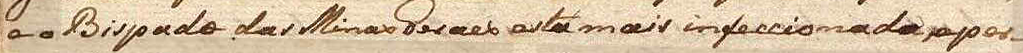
e o Bispado das Minas Geraes esta mais infeccionado, e per
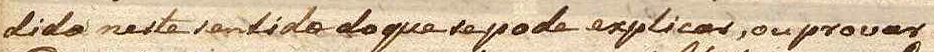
dido neste sentido do que se pode explicar, ou provar.
